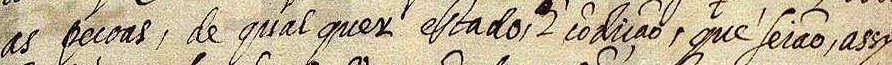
as peçoas, de qualquer estado, E cōdição, que seião, assy
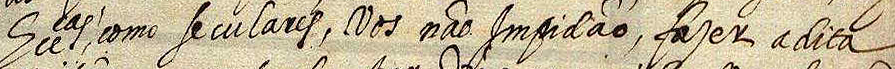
Ecccas, como seculares, vos não Jmpidão, fazer a dita
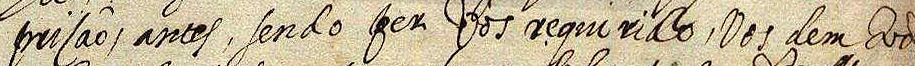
prizão, antes, sendo per Vós requirido, vos dem todo
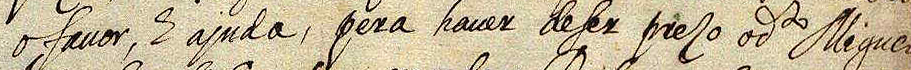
o fauor, E ajuda, pera hauer de ser prezo o dto Miguel
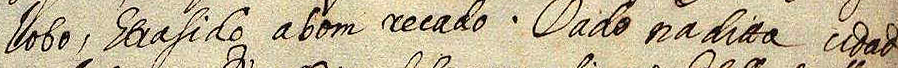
lobo, E trasido a bom recado. Dado na ditta cidade
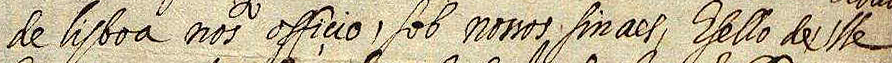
de lisboa no sto officio, sob nossos sinaes, E sello delle
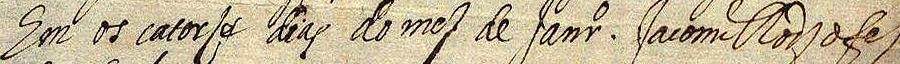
Em os catorze dias do mez de Janro. Jacome Rōiz o fez
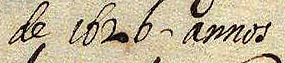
de 1626 annos.
